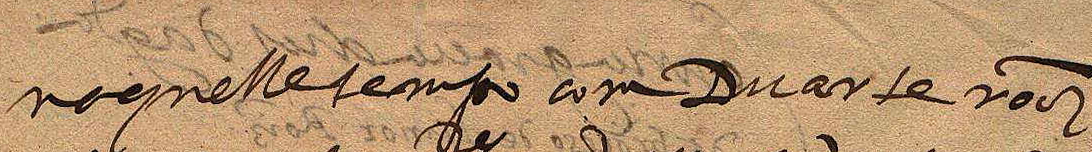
naquelle tempo com Duarte rōiz
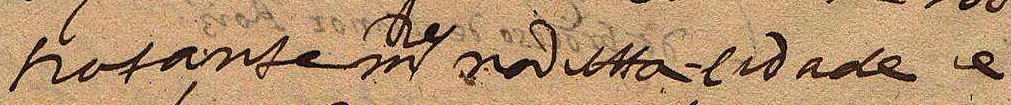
tratante mor na ditta cidade e
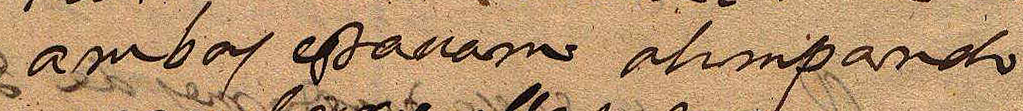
ambas estauam alimpando
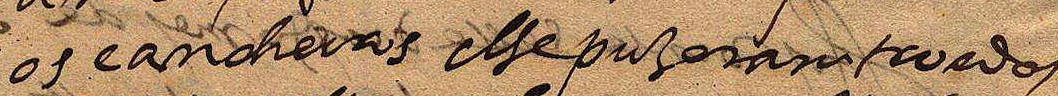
os candieiros e lhe puzeram trocidas
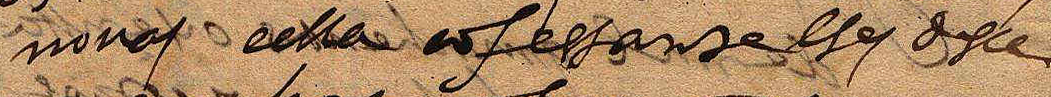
nouas e ella cōfessante lhes disse
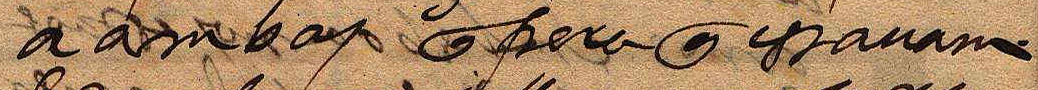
a ambas q̄ pera q̄ estauam
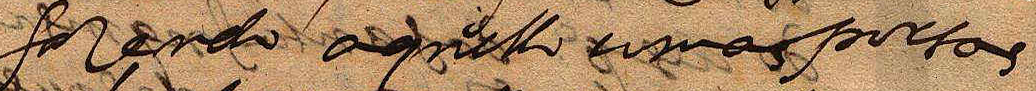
fazendo aquillo com as portas
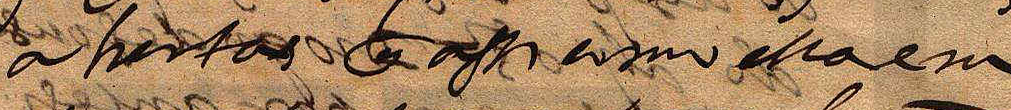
abertas q̄ assi como ella em
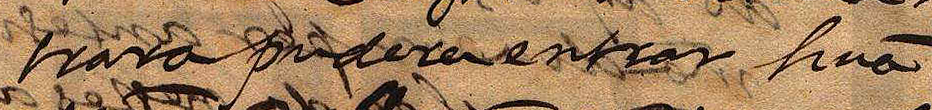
trara pudera entrar huā
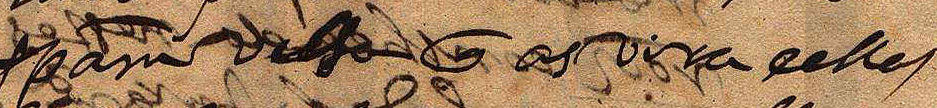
xpām velha q̄ as vira e elles
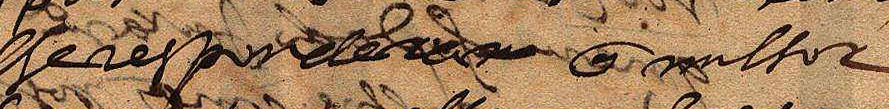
lhe responderam q̄ milhor
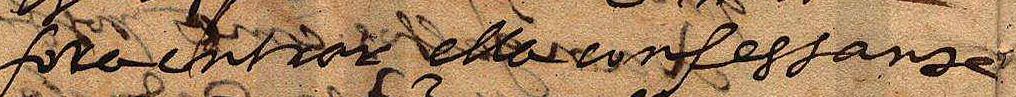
fora entrar ella confessante
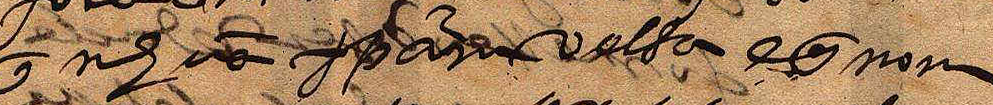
q̄ nhuā xpam velha e q̄ nom
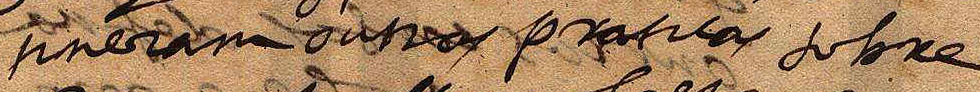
tiueram outras praticas sobre
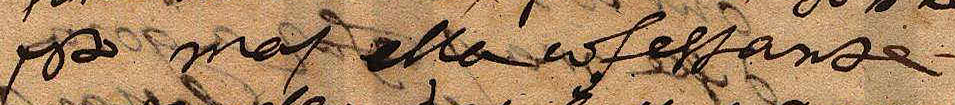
jsto mas ella cōfessante
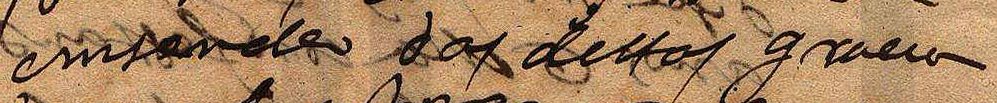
emtendeo das dittas gracia
